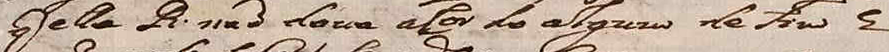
q̄ ella R. naõ daua aCordo algum de sim E
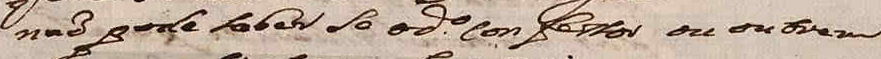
naõ pode saber se o d.o confessor ou outrem
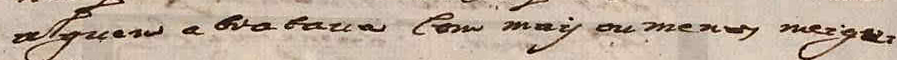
alguem a trataua com mais ou menos meigui
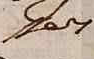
sses
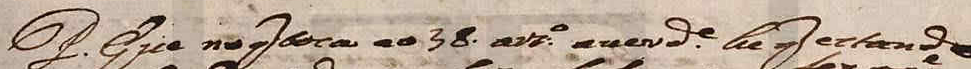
P. Que no q̄ toca ao 38. art.o a uerd.e he q̄ estando
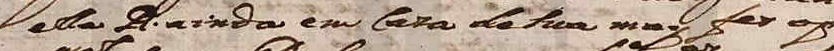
ella R. ainda em Caza de sua may fes o p.e
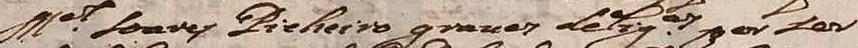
M.el soares Picheiro graues delig.as por ser
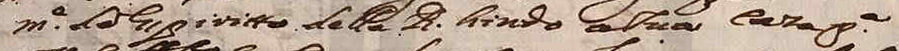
m.e do Espirito della R. hindo a sua caza p.a
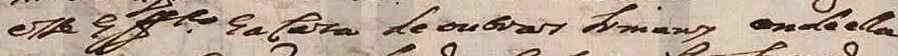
esse Eff.to E a Caza de outras Irmans onde ella
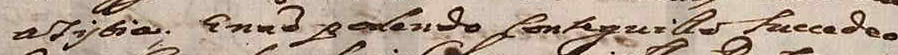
asistia; E naõ podendo Conseguillo succedeo
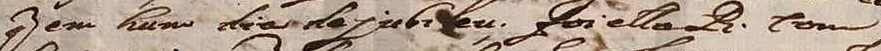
q̄ em hum dia de jubileu; foi ella R. com
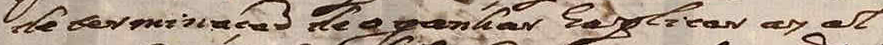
determinaçaõ de o ganhar E aplicar as al
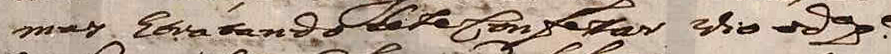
mas E tratando de se Confessar vio o d.o p.e
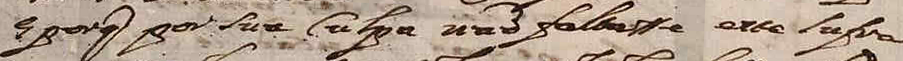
E porq̄ por sua Culpa naõ faltasse este sufra
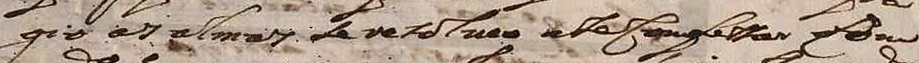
gio as almas se resolueo a se Confessar Com
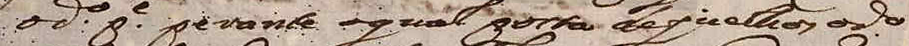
o d.o p.e perante o qual posta da juelhos o d.o
